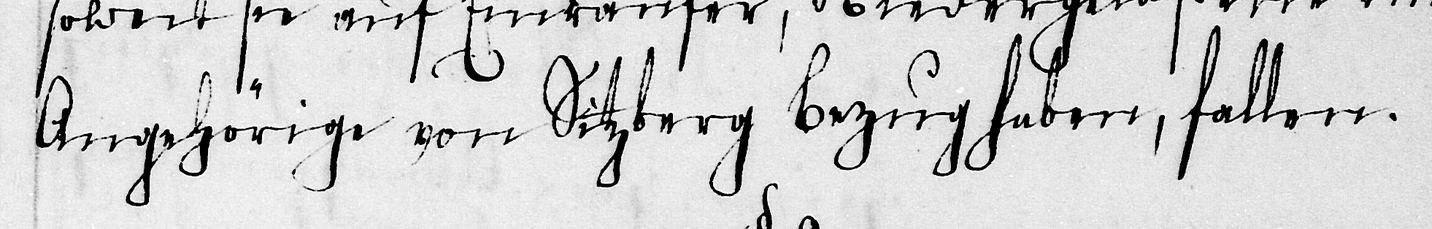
Angehörige von Sitzberg Bezug haben, fallen.
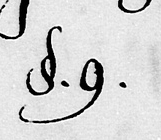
§. 9.
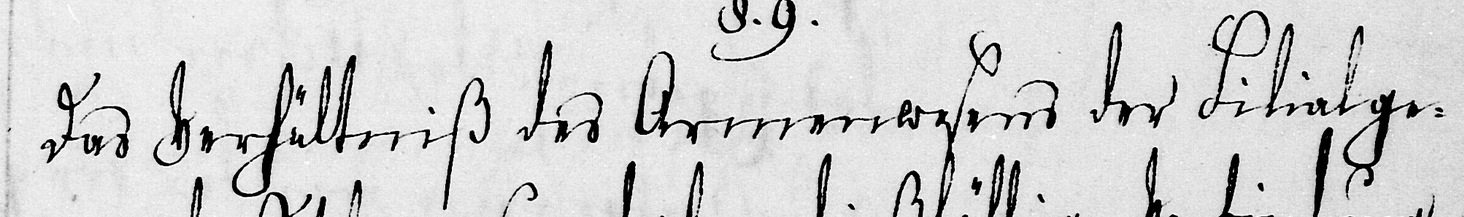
Das Verhältniß des Armenwesens der Filialge¬
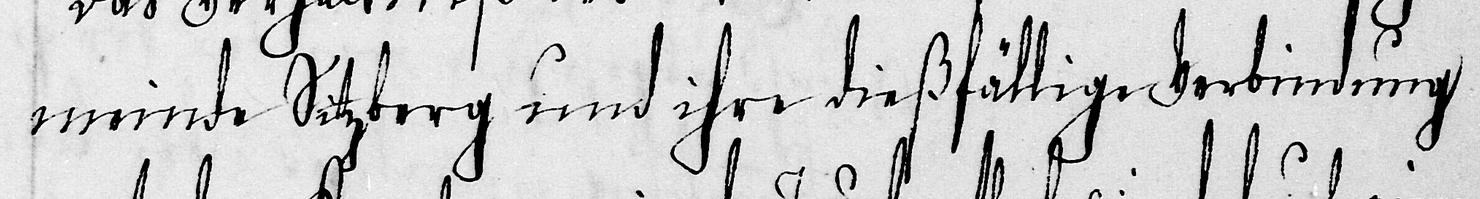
meinde Sitzberg und ihre dießfällige Verbindung
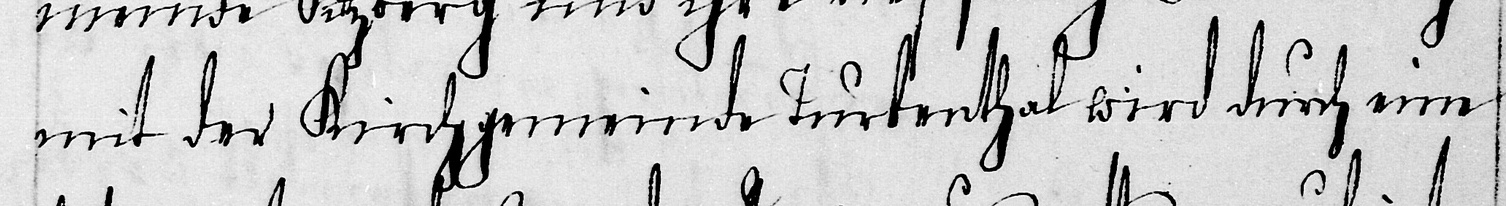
mit der Kirchgemeinde Turbenthal wird durch eine
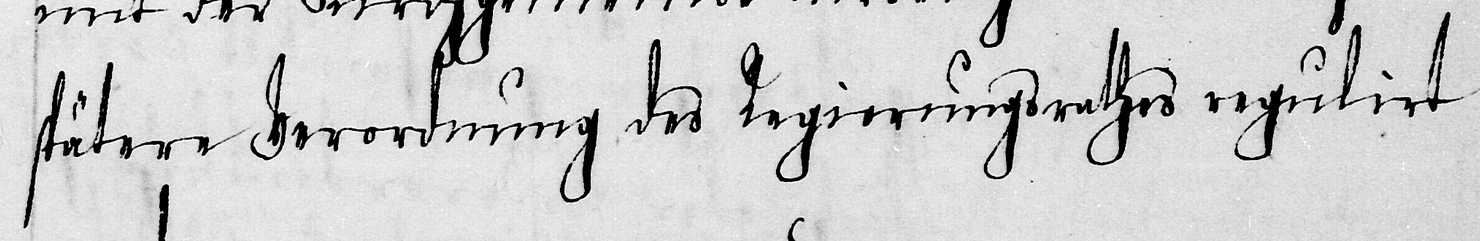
spätere Verordnung des Regierungsrathes regulirt
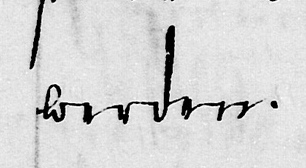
werden.
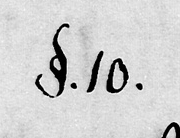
§. 10.
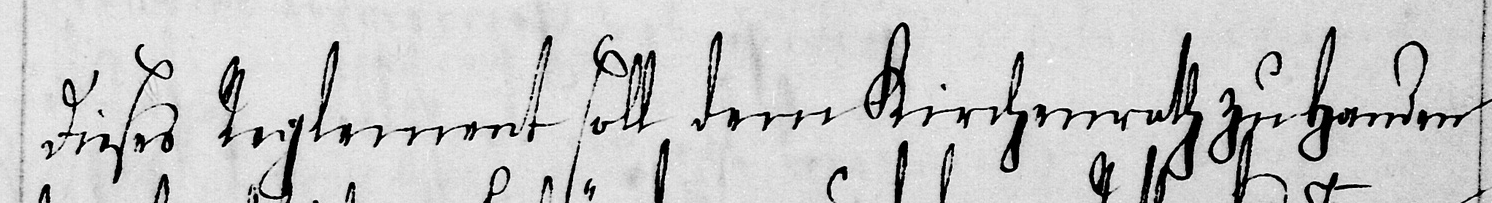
Dieses Reglement soll dem Kirchenrath zu Handen
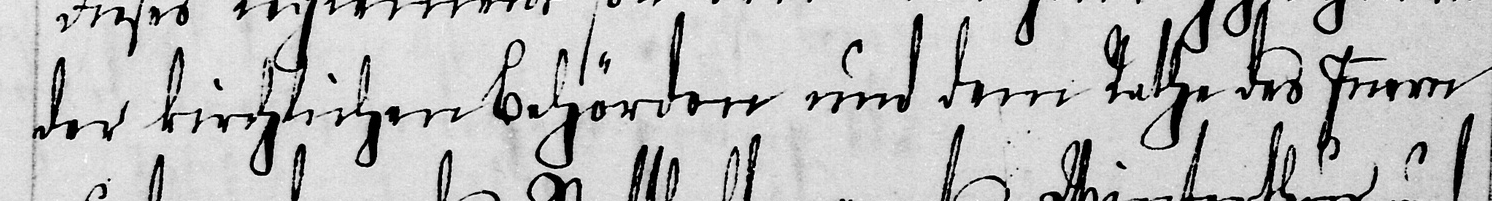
der kirchlichen Behörden und dem Rathe des Inne¬
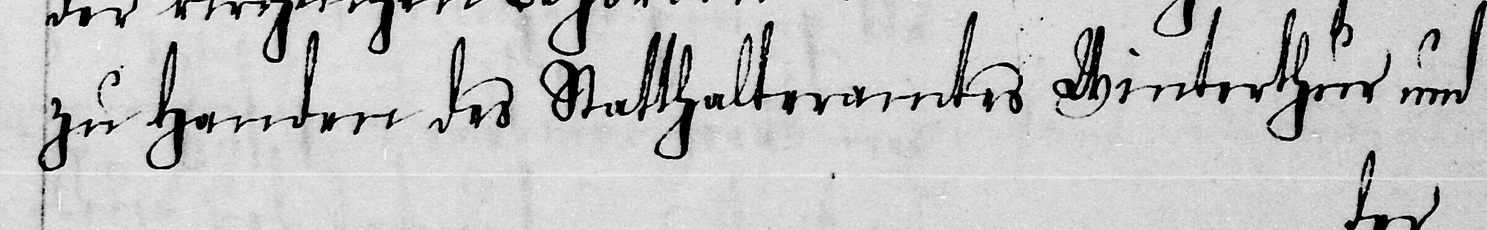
zu Handen des Statthalteramtes Winterthur und
